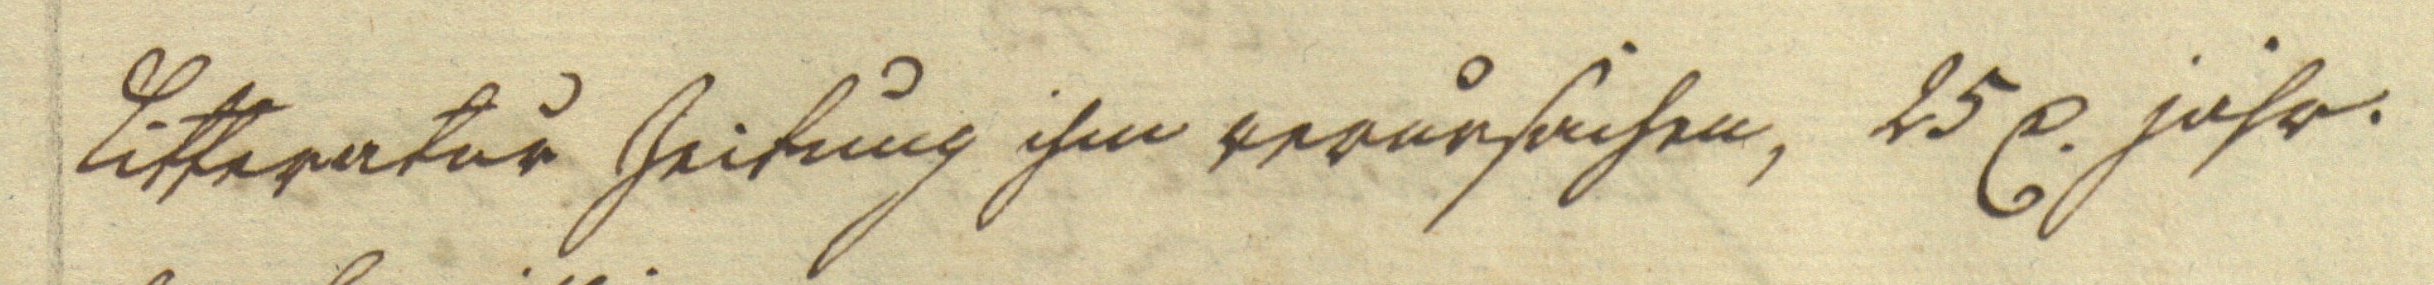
Litteratur Zeitung ihm verursachen, 25 l. jähr¬
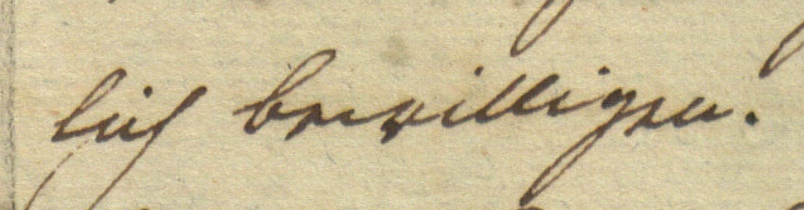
lich bewilligen.
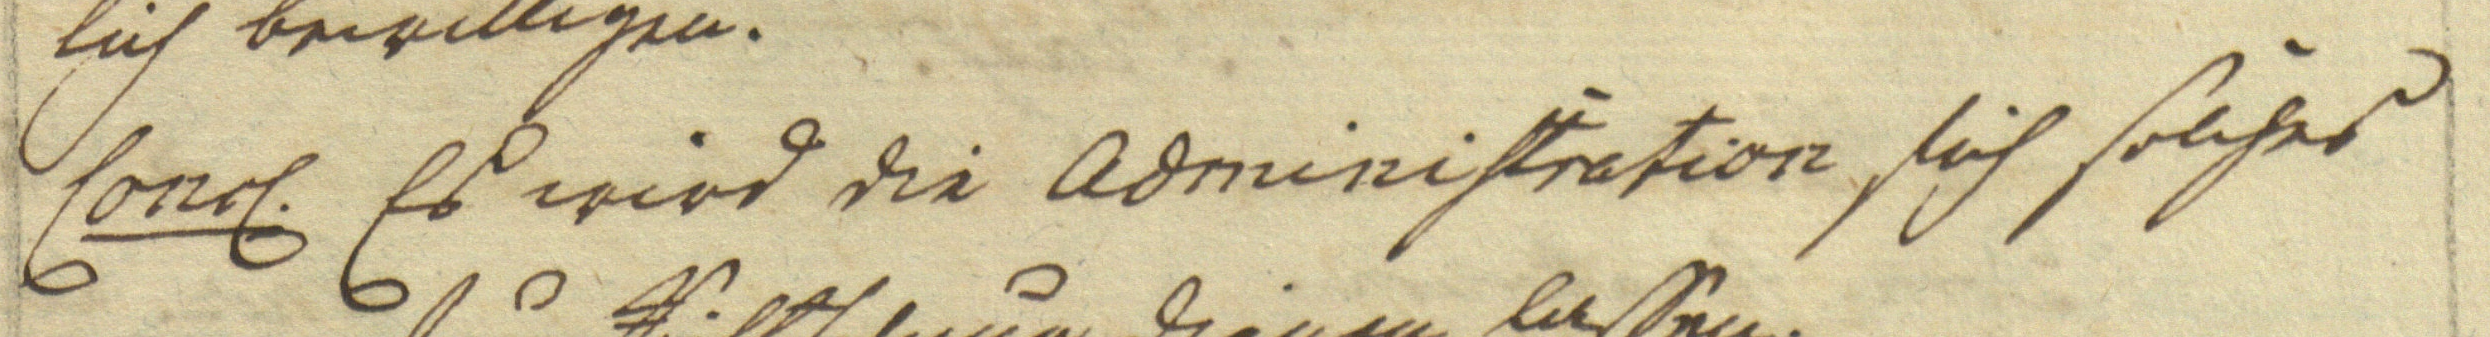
Concl. Es wird die Administration sich solches
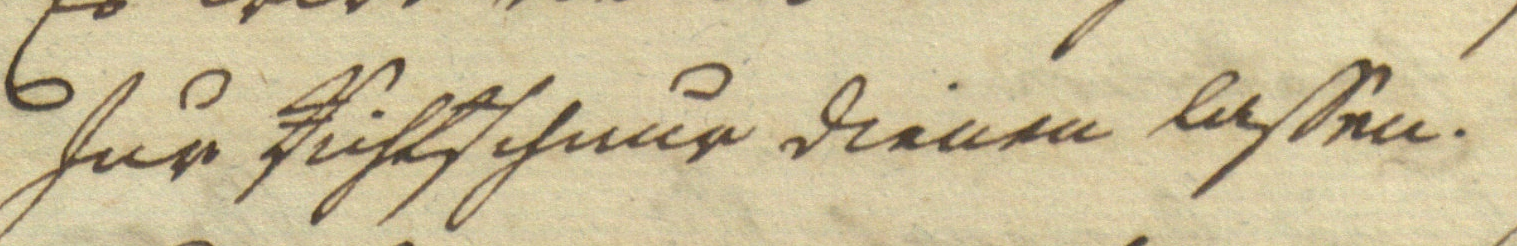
zur Richtschnur dienen lassen.
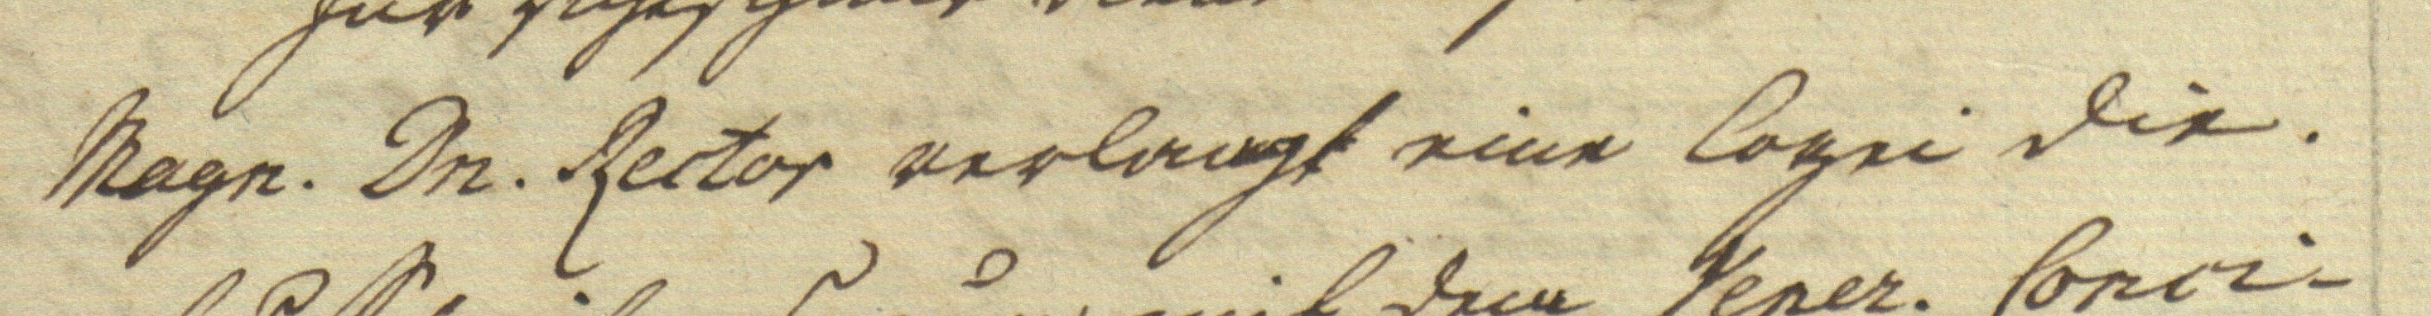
Magn. Dn. Rector verlangt eine Copei die¬
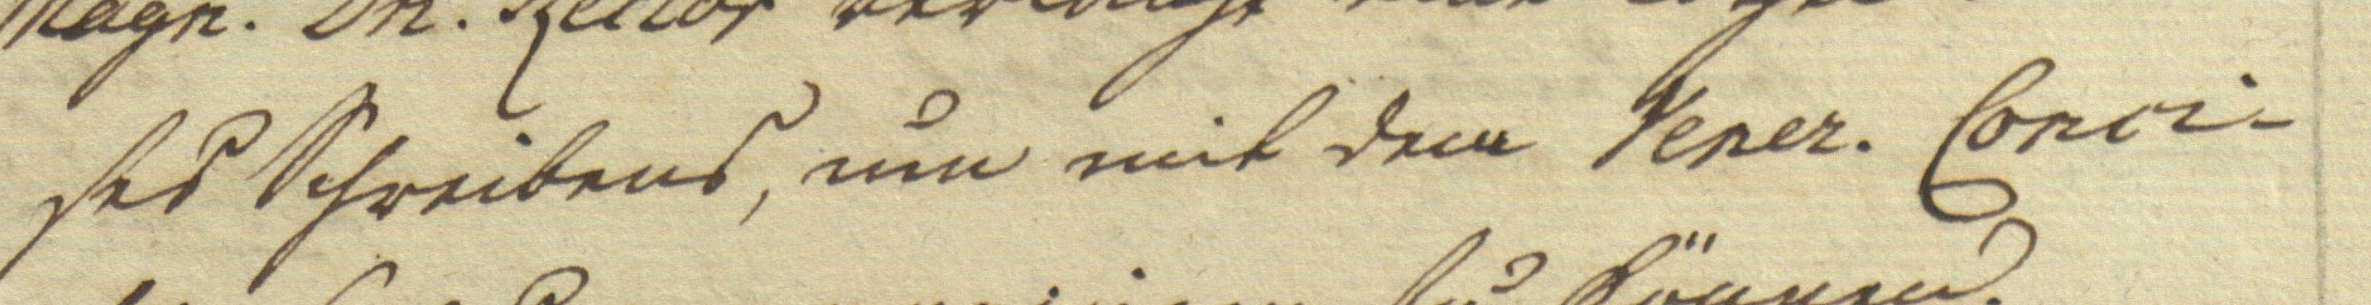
ses Schreibens, um mit dem Vener. Conci¬
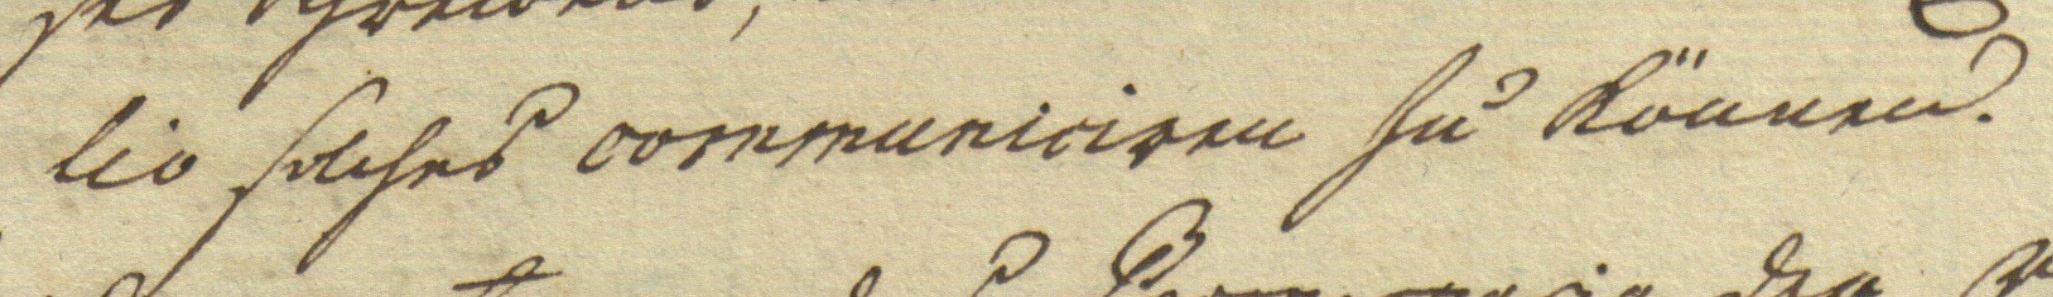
lio solches communiciren zu können.
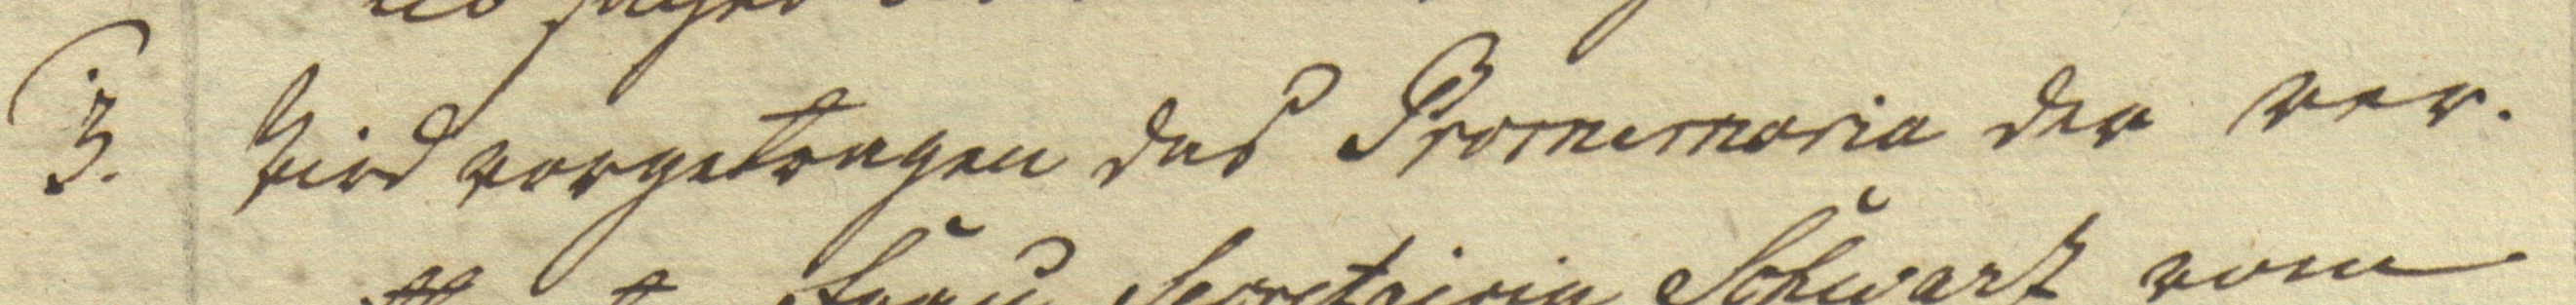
3. Wird vorgetragen das Promemoria der ver¬
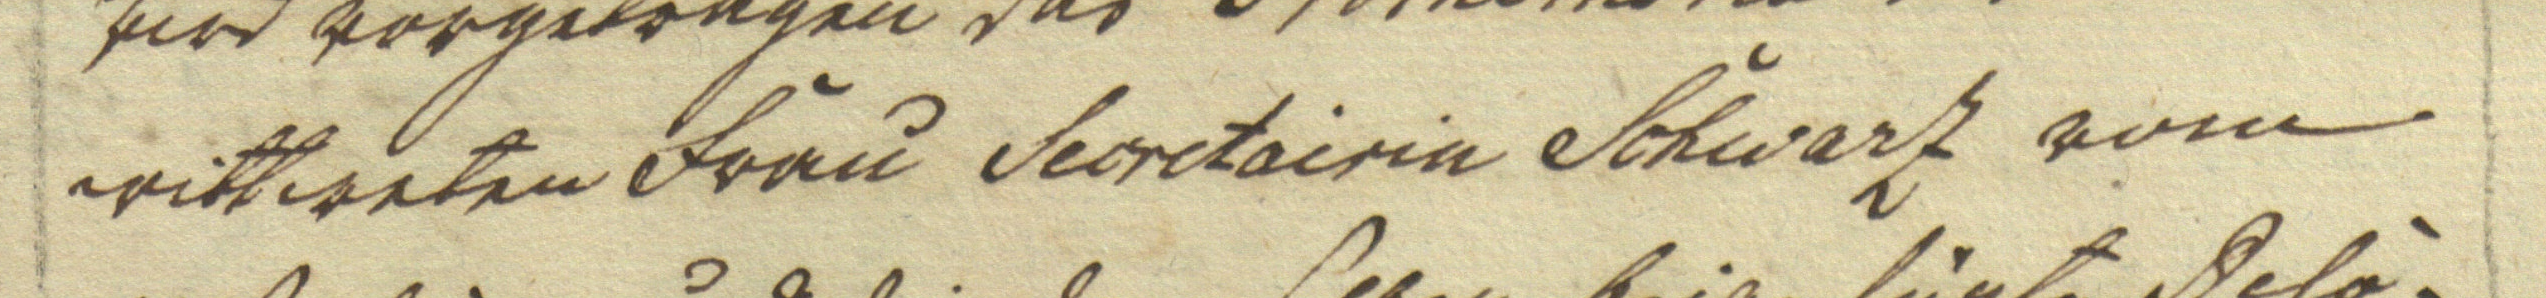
wittweten Frau Secretairin Schwarz vom
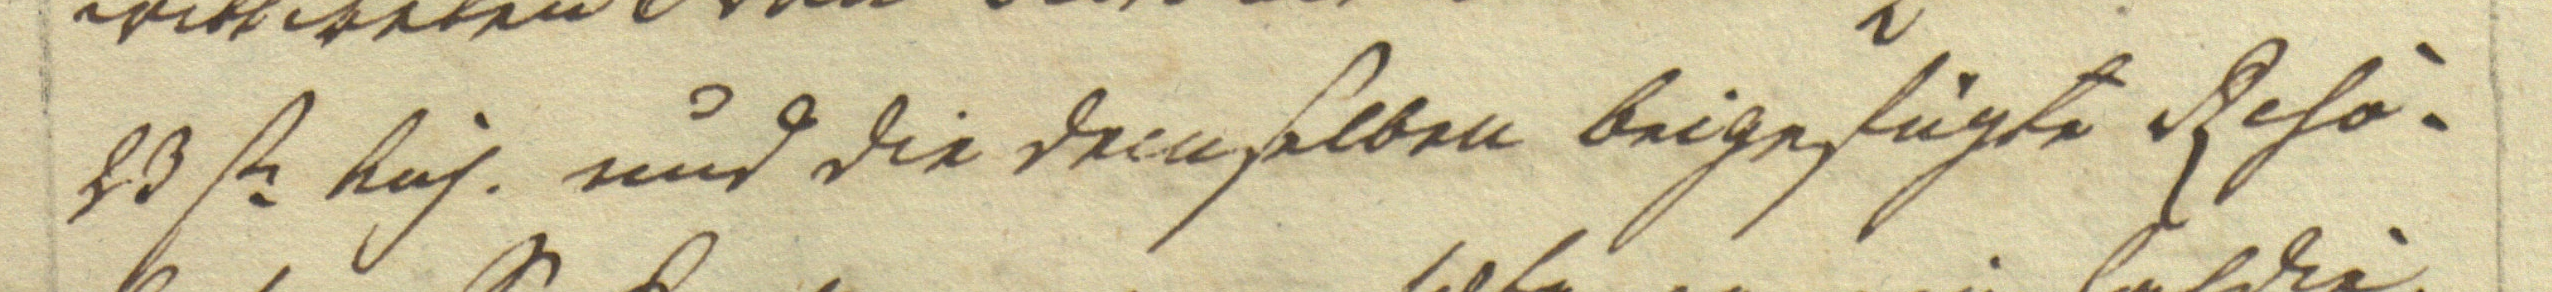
23 st huj. und die demselben beigefügte Reso-
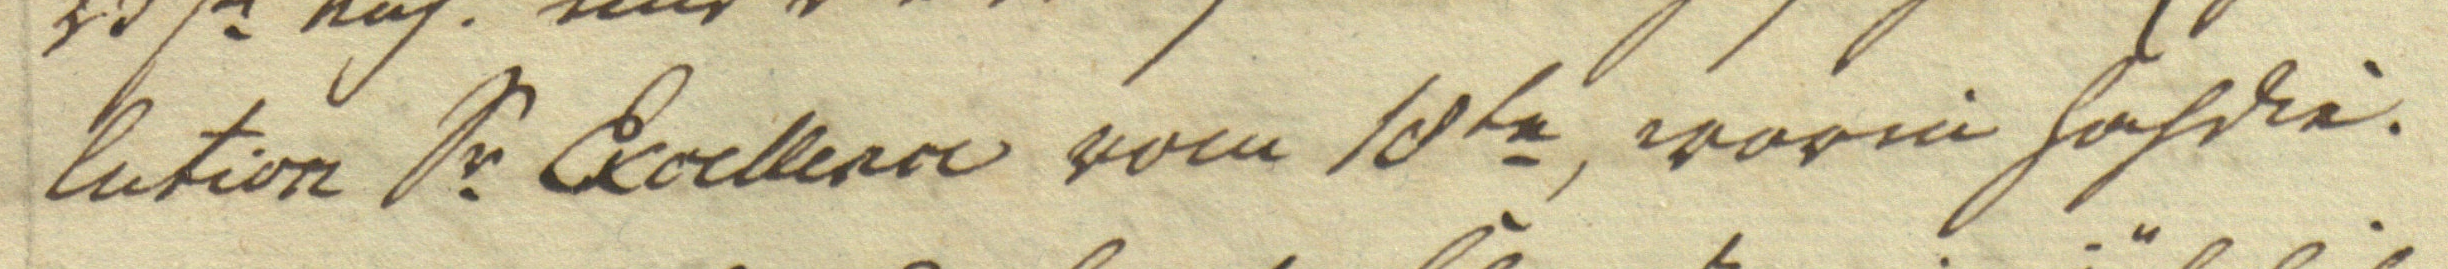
lution Sr Excellence vom 18 te, worin Hochdie¬
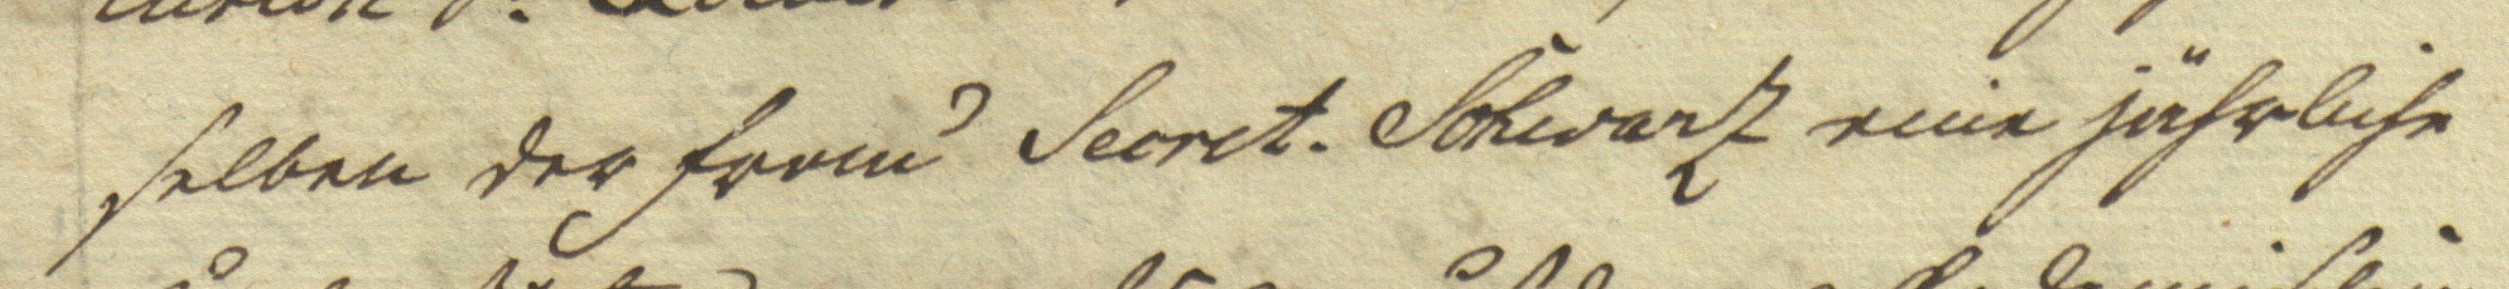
selben der Frau Secret. Schwarz eine jährliche
